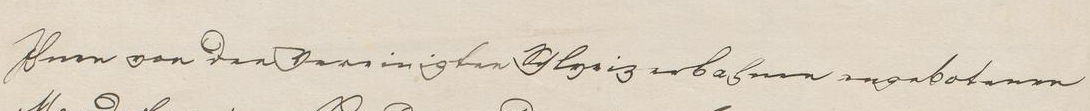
Ihnen von den Vereinigten Schweizerbahnen angebotenen
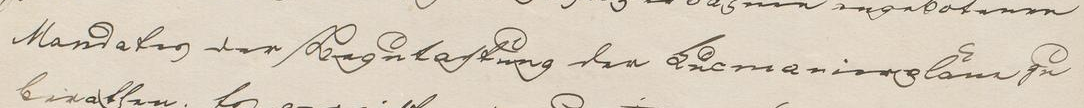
Mandates der Begutachtung der Lucmanierpläne zu
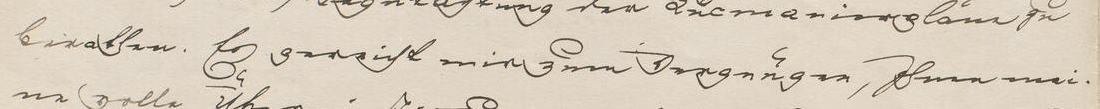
berathen. Es gereicht mir zum Vergnügen, Ihnen mei-
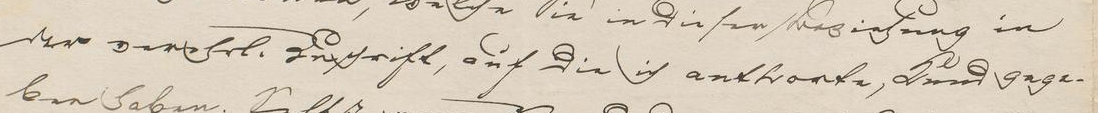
der verehrl. Zuschrift, auf die ich antworte, Kund gege-
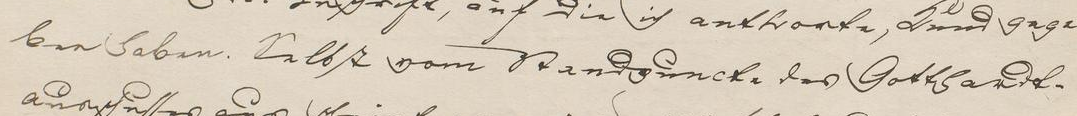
ben haben. Selbst vom Standpuncte des Gotthardt -
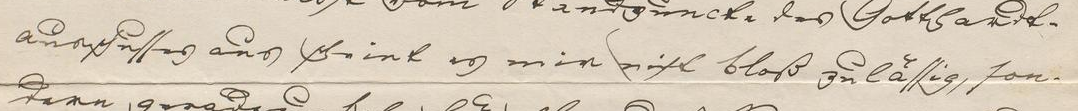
ausschusses aus scheint es mir nicht bloß zulässig, son-
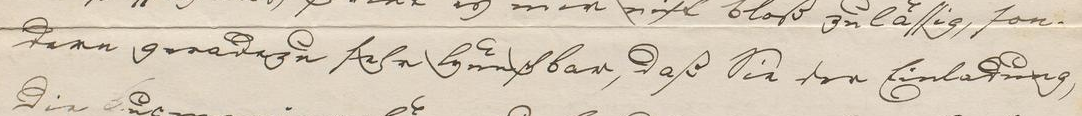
dern geradezu sehr wünschbar, daß Sie der Einladung,
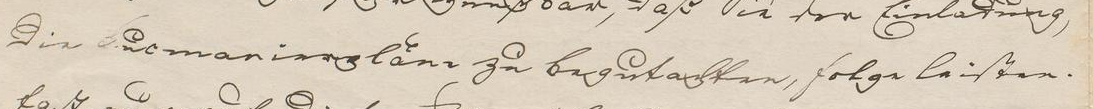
die Lucmanierpläne zu begutachten, Folge leisten.
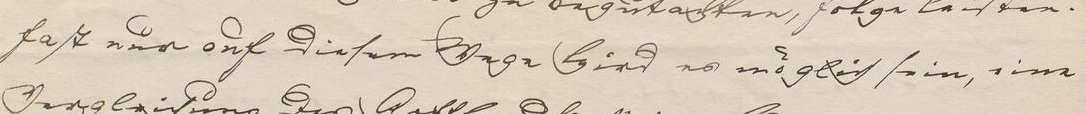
Fast nur auf diesem Wege wird es möglich sein, eine
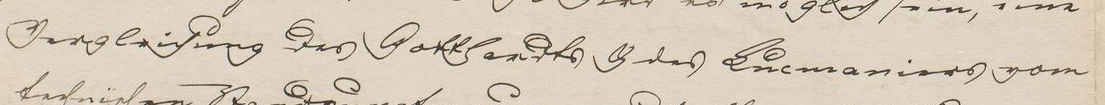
Vergleichung des Gotthardts & des Lucmaniers vom
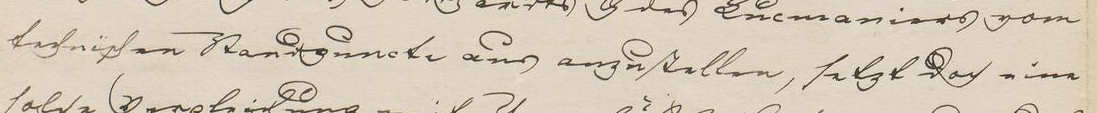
technischen Standpuncte aus anzustellen, setzt doch eine
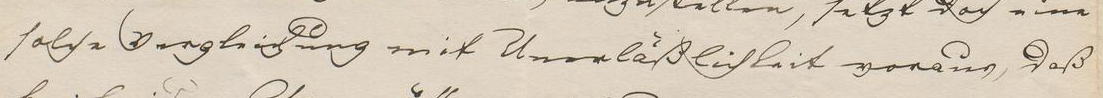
solche Vergleichung mit Unerläßlichkeit voraus, daß
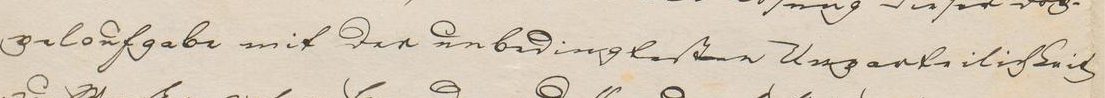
pelaufgabe mit der unbedingtesten Unparteilichkeit
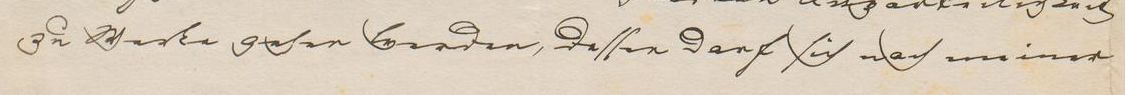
zu Werke gehen werden, dessen darf sich nach meiner
